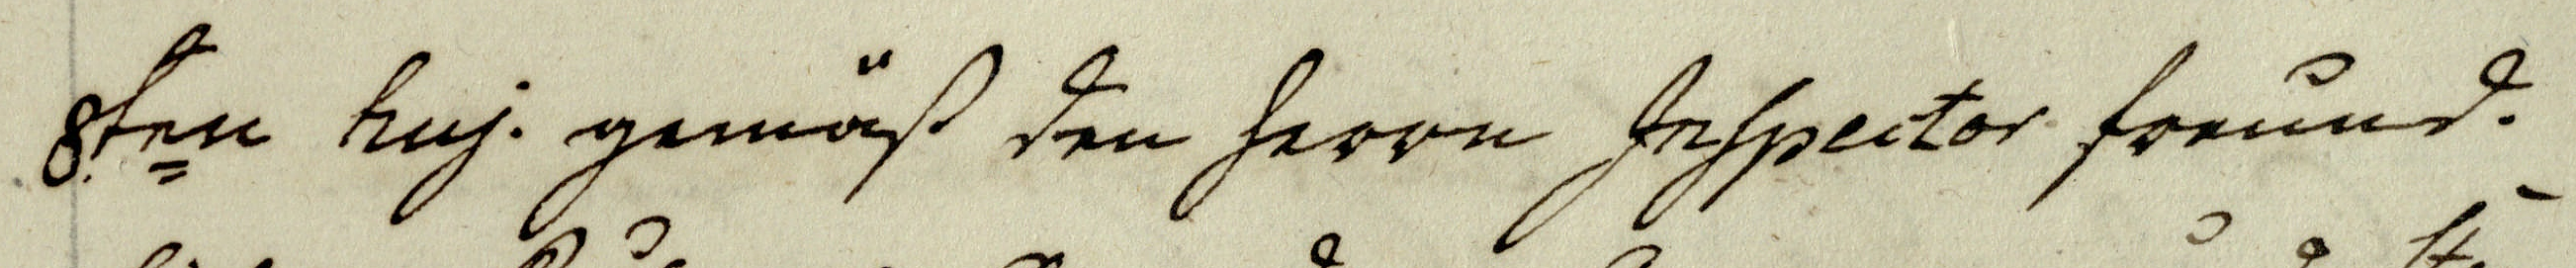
8 ten huj. gemäß den Herrn Inspector freund¬
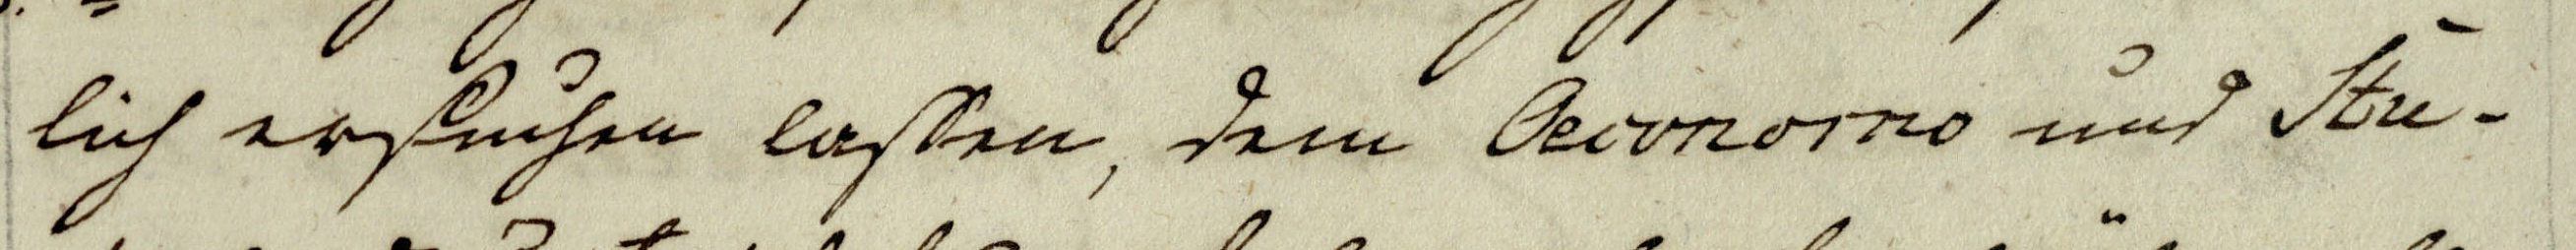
lich ersuchen lassen, dem Oeconomo und Stu¬
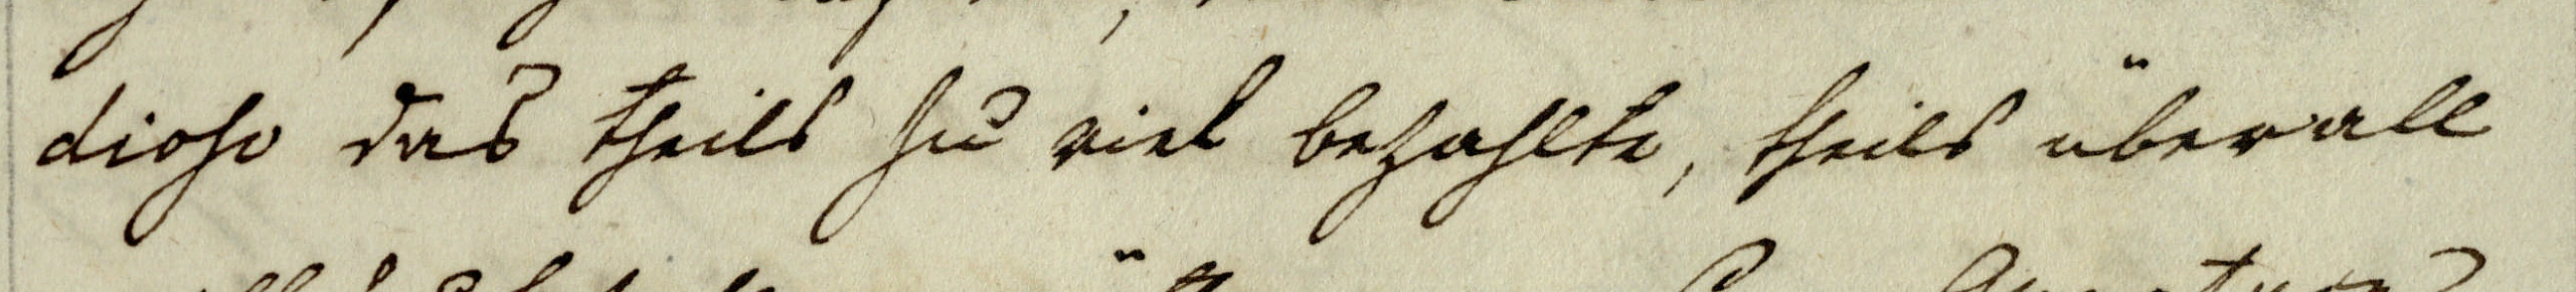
dioso das theils zu viel bezahlte, theils überall
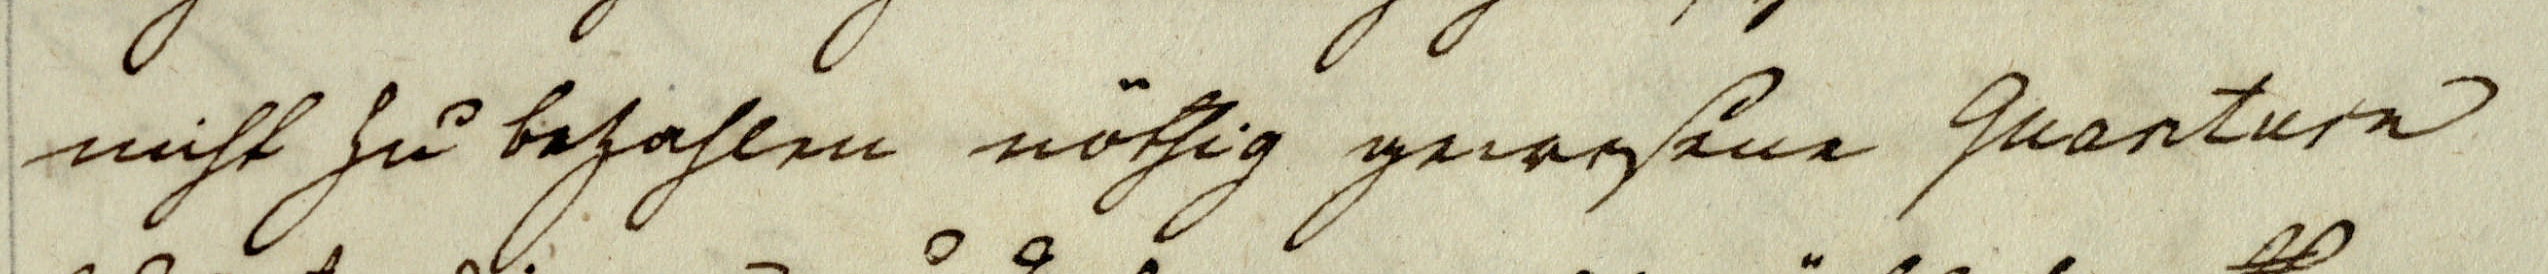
nicht zu bezahlen nöthig gewesene Quantum
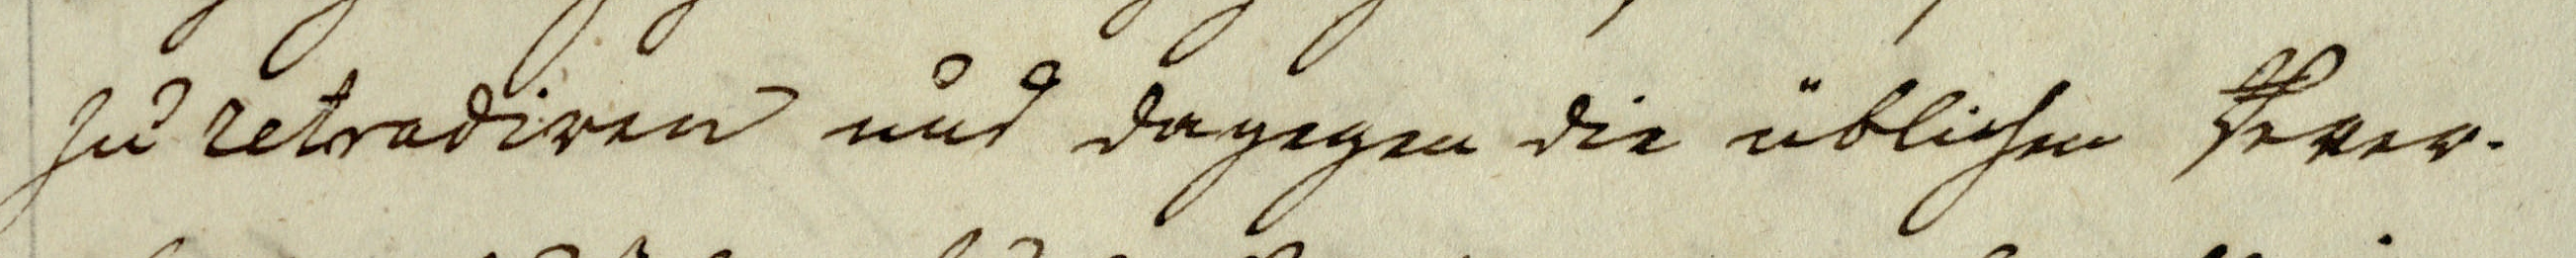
zu retradien und dagegen die üblichen Rever¬
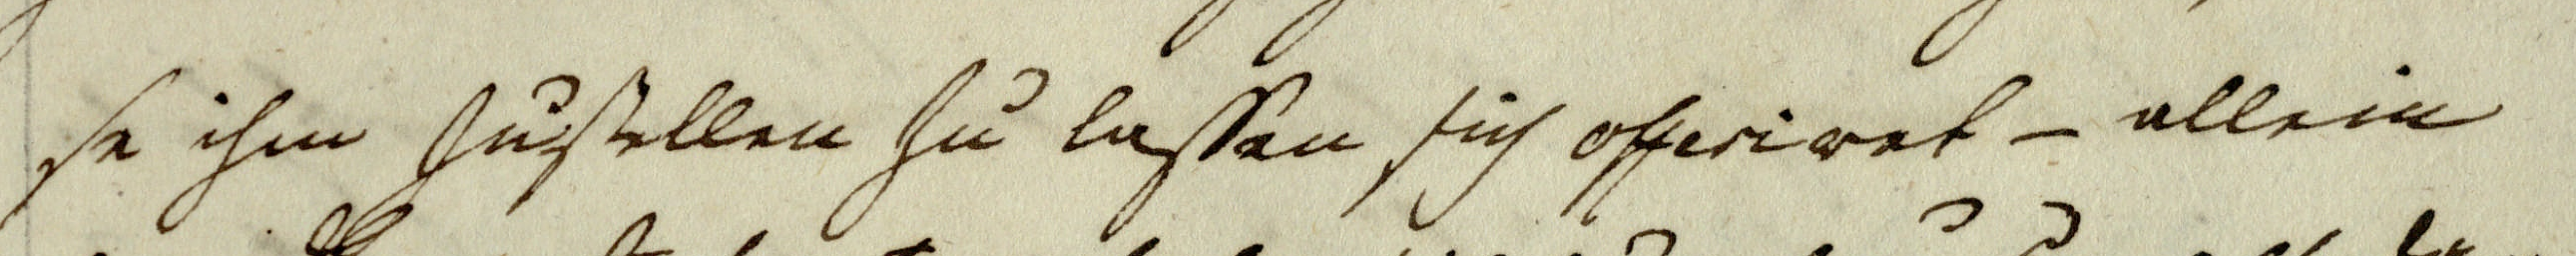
se ihm zustellen zu lassen sich offeriret allein
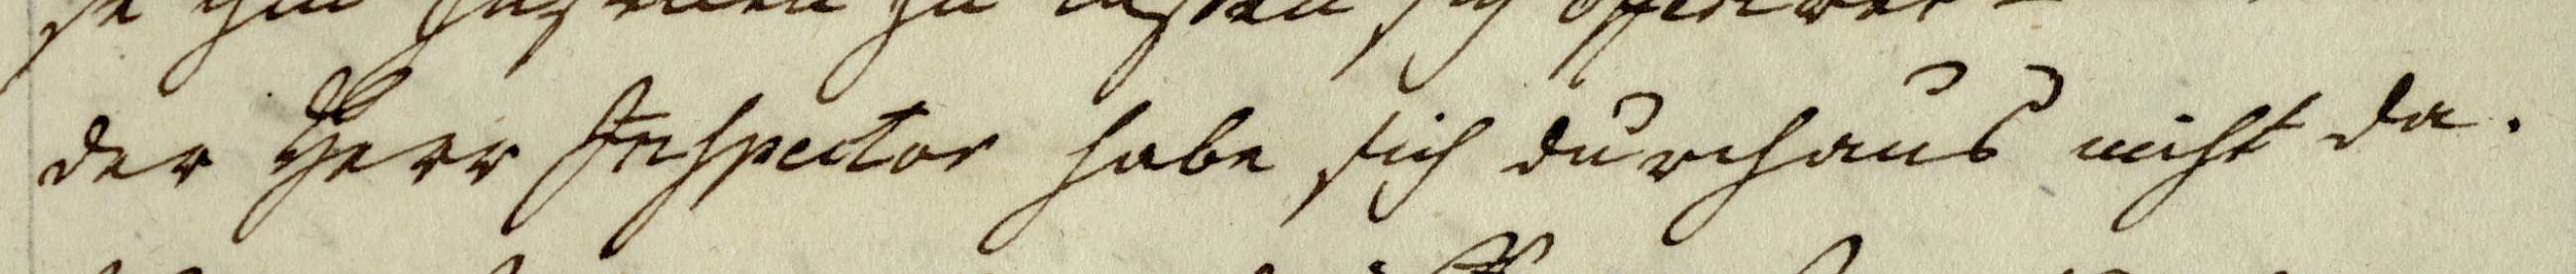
der Herr Inspector habe sich durchaus nicht da¬
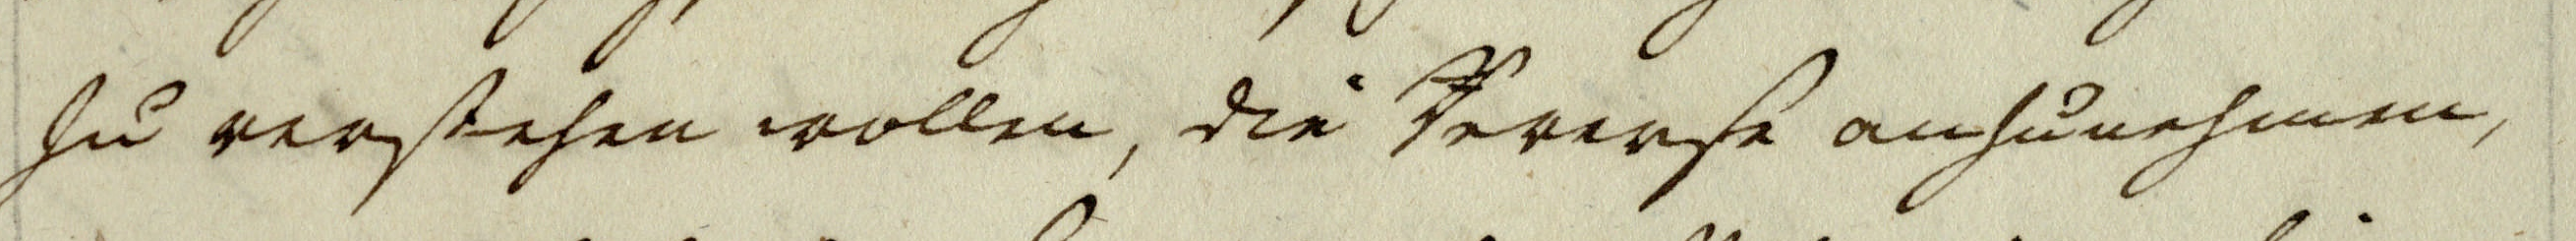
zu verstehen wollen, die Reverse anzunehmen,
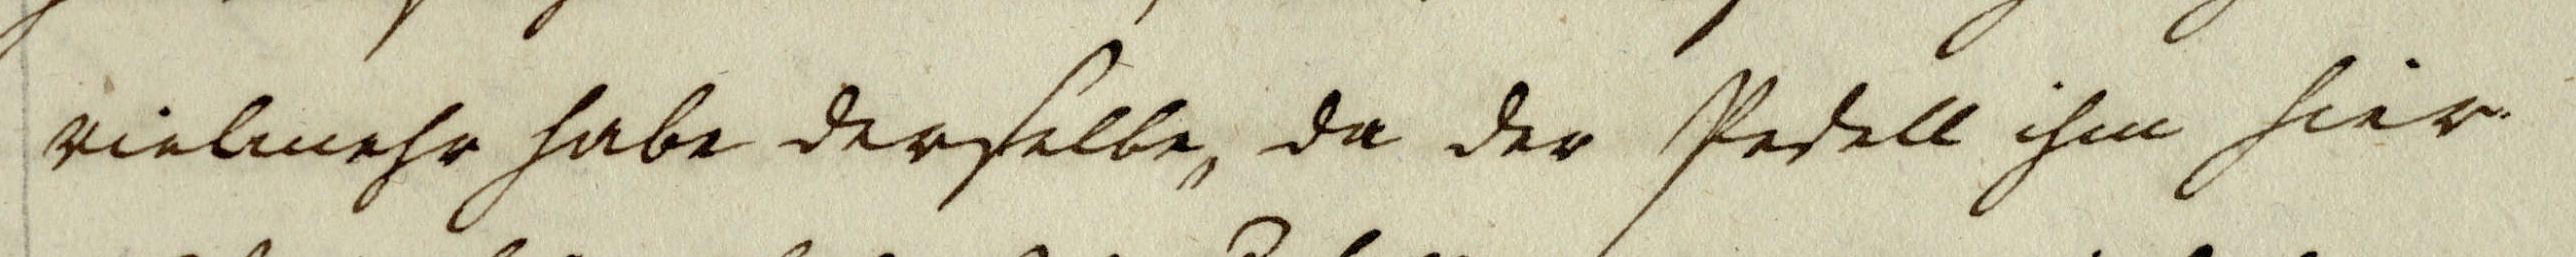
vielmehr habe derselbe, da der Pedell ihm hier¬
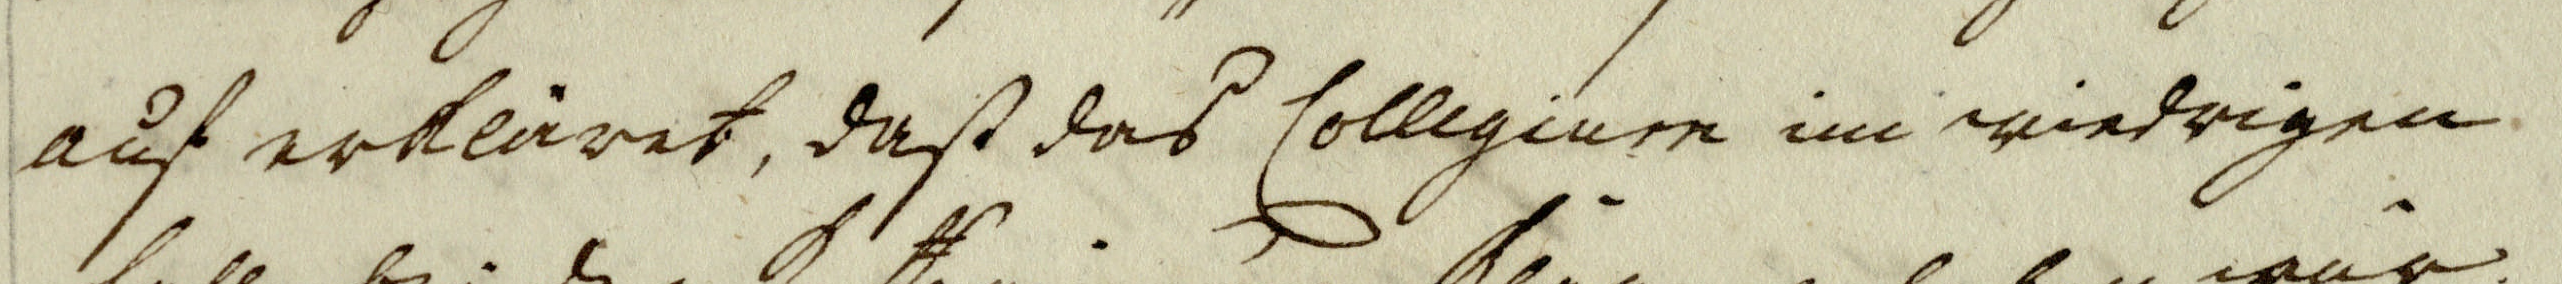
auf erkläret, daß das Collegium in wiedrigen
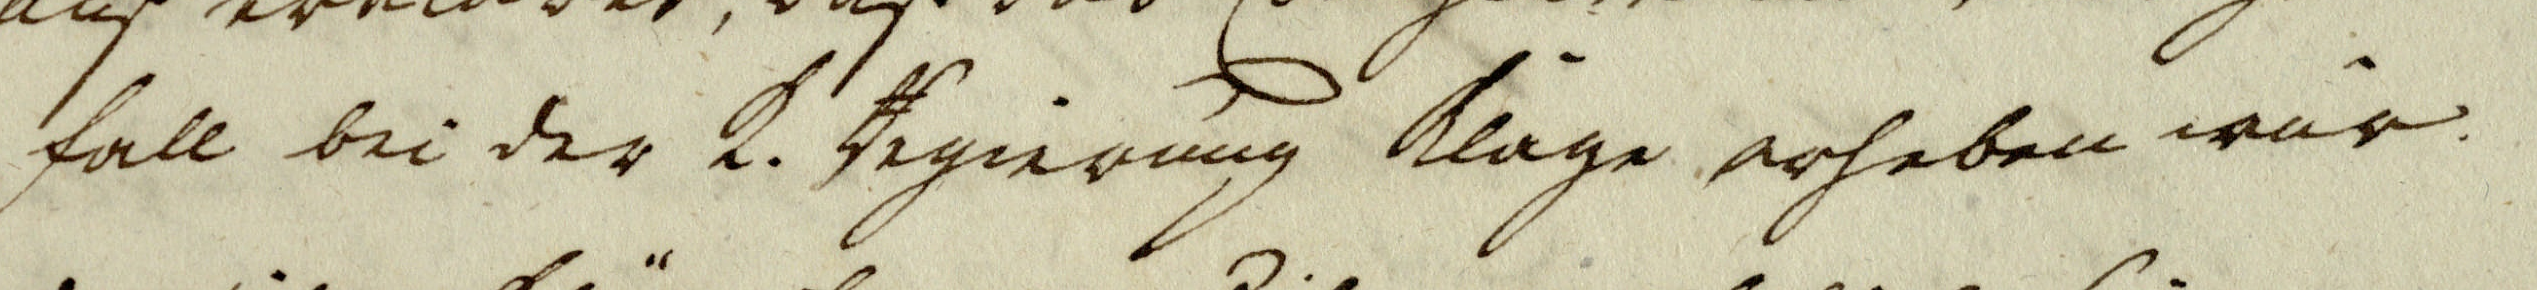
Fall bei der K. Regierung Klage erheben wür¬
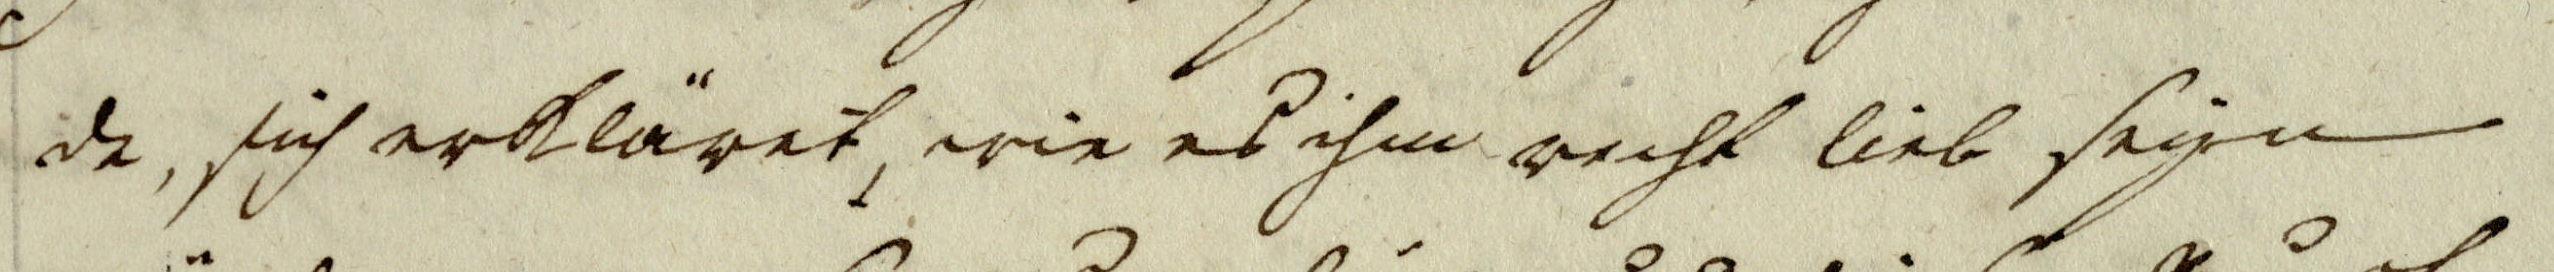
de, sich erkläret, wie es ihm recht lieb sein
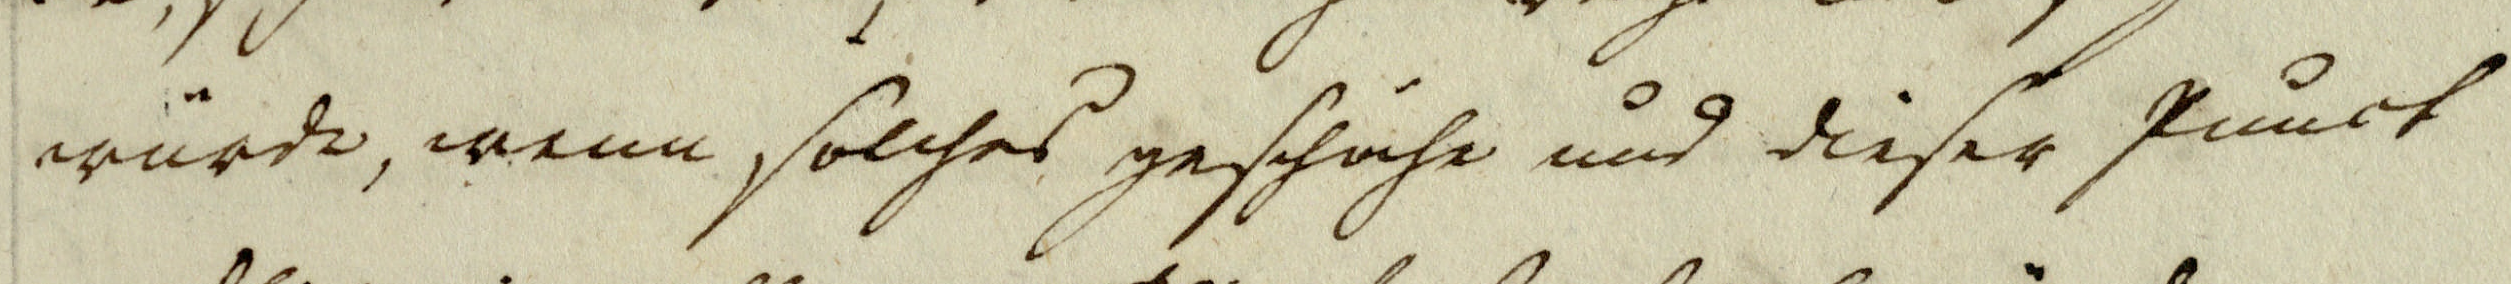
würde, wenn solches geschähe und dieser Punct
